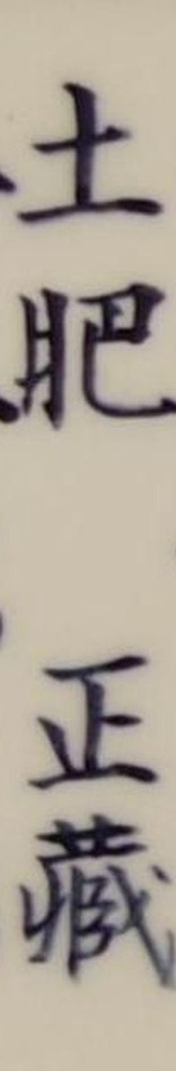土肥正蔵
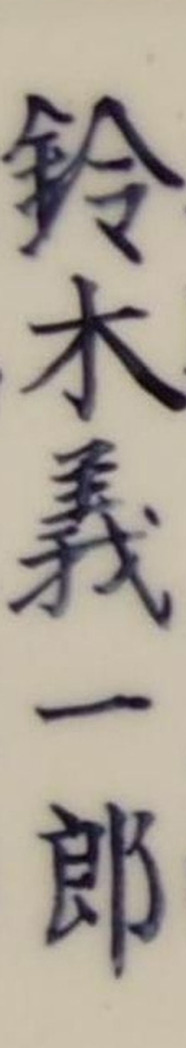鈴木義一郎
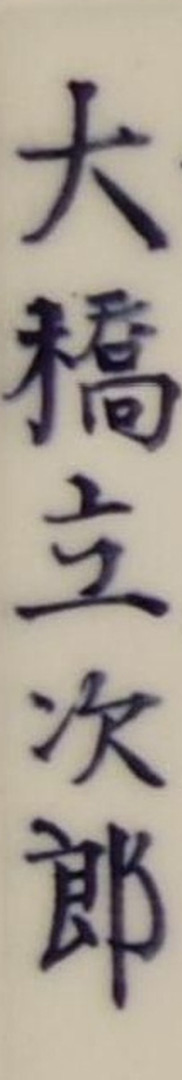大橋立次郎

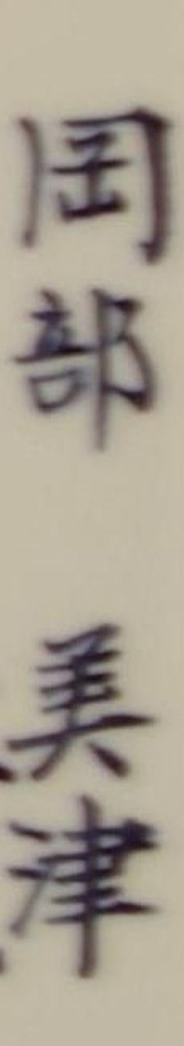岡部美津
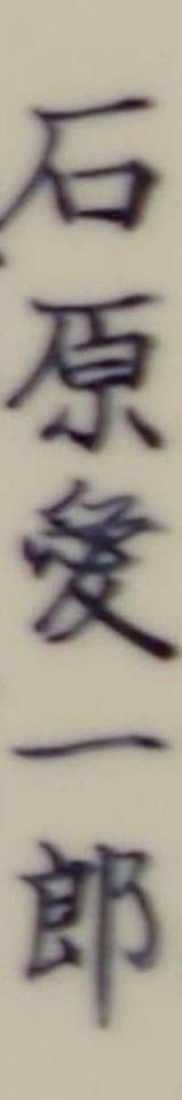石原愛一郎
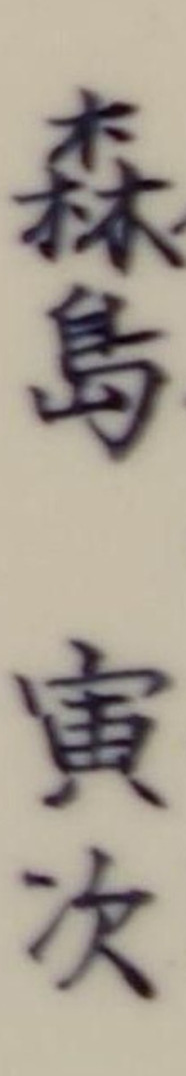森島寅次
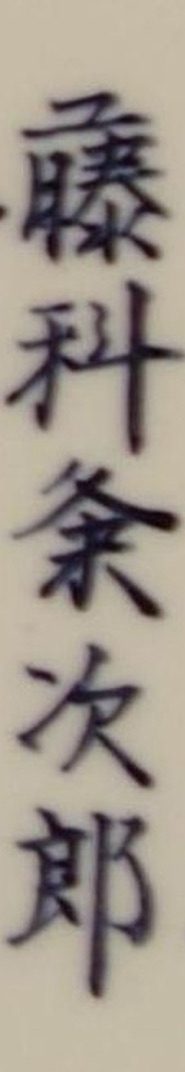藤科条次郎
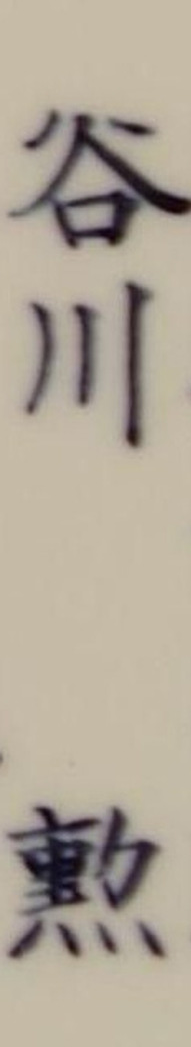谷川勲
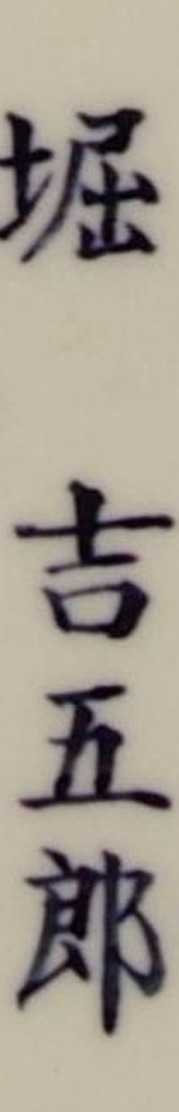堀吉五郎
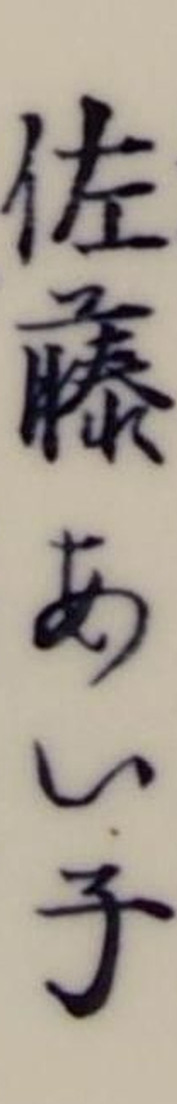佐藤あい子
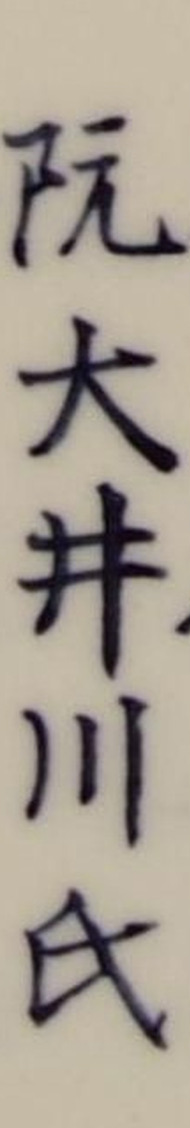阮大井川氏

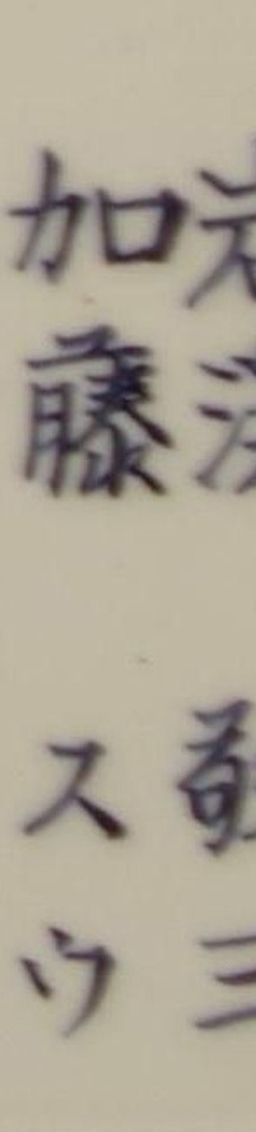加藤スウ
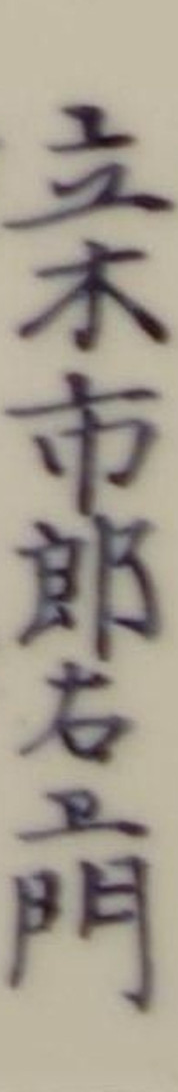立木市郎右ヱ門
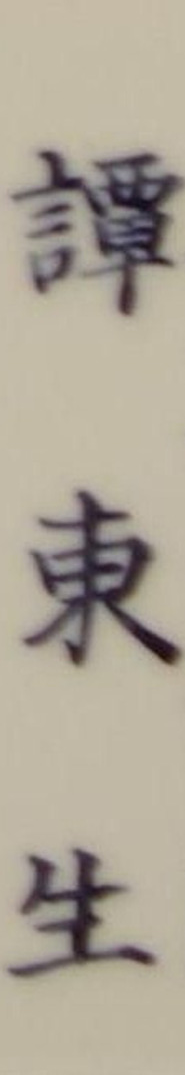譚東生
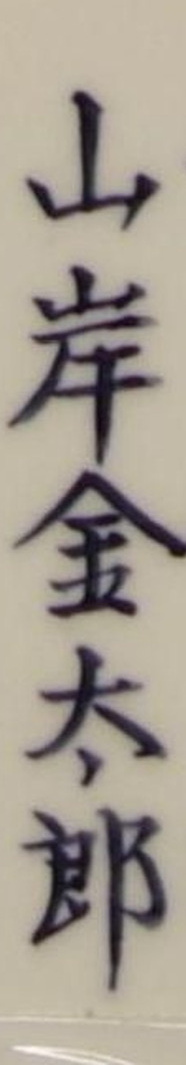山岸金太郎
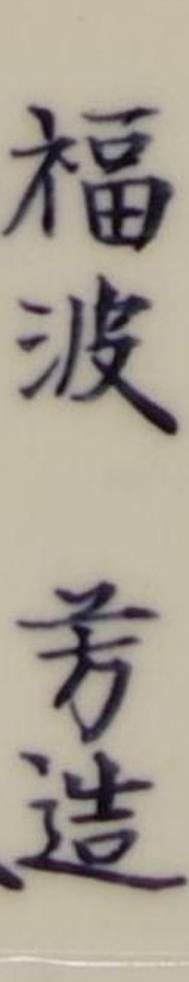福波芳造
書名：M~S
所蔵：高野山金剛峯寺
